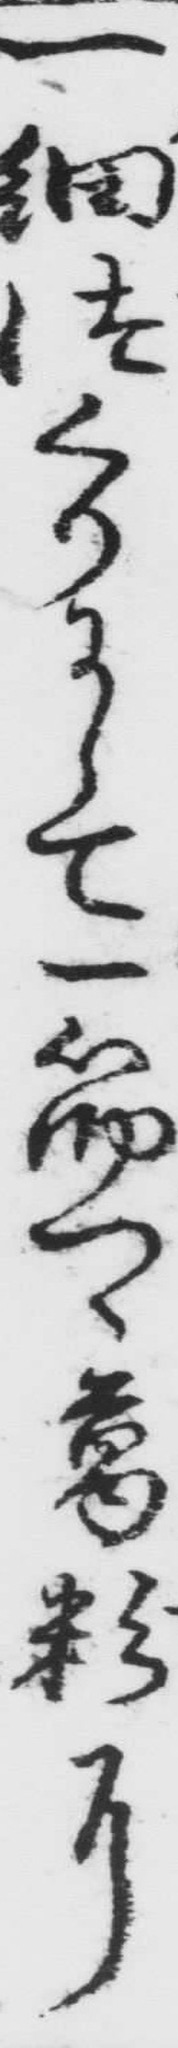一細づくりにして一筋づゝ葛粉に
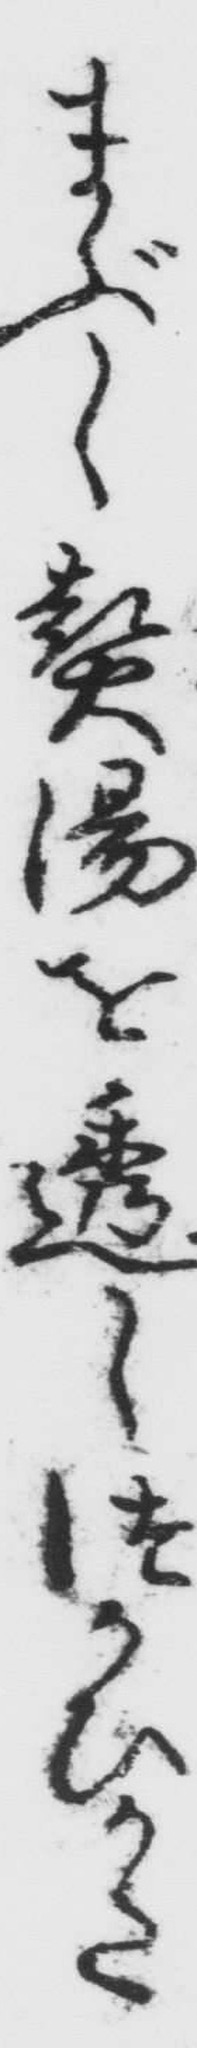まぶし熱湯を透しつかひかた
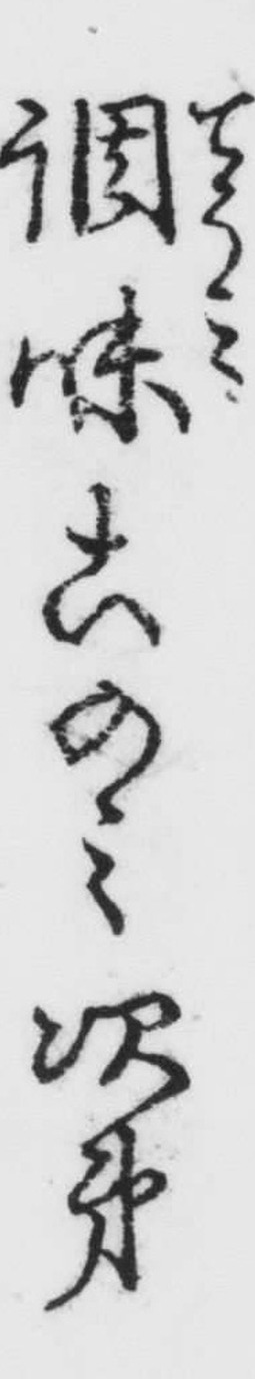調味このみ次第
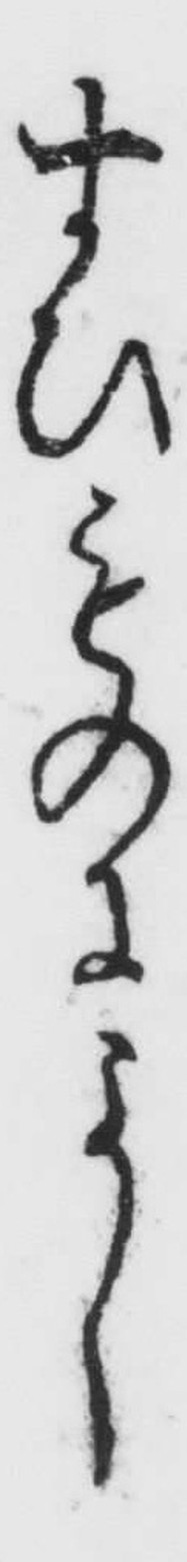すひものによし
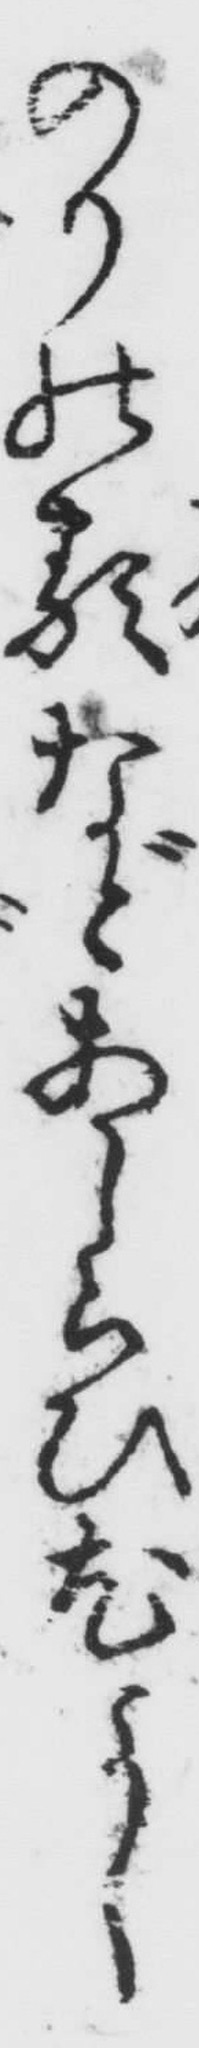のりの類などあしらひ尤よし
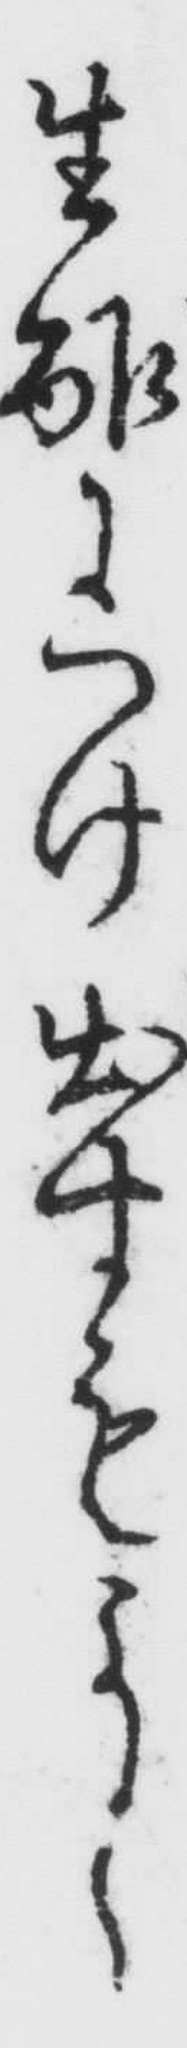生酢につけ出すもよし
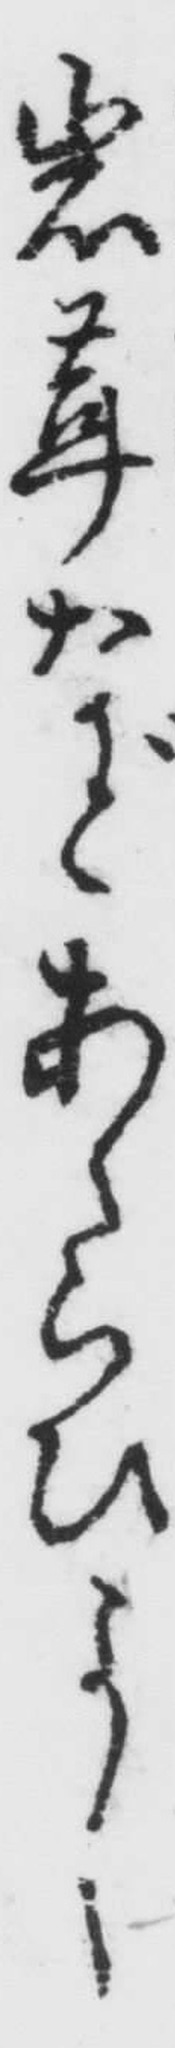岩茸などあしらひよし

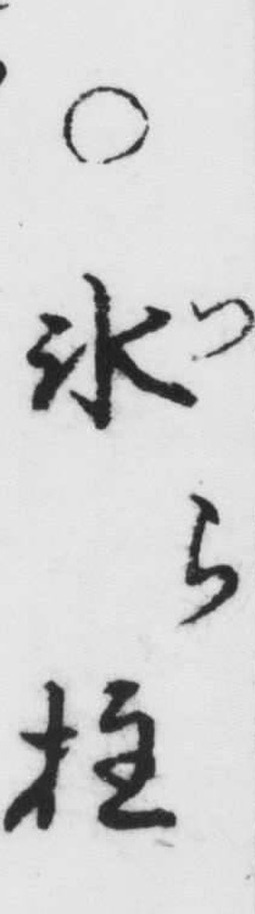○氷柱
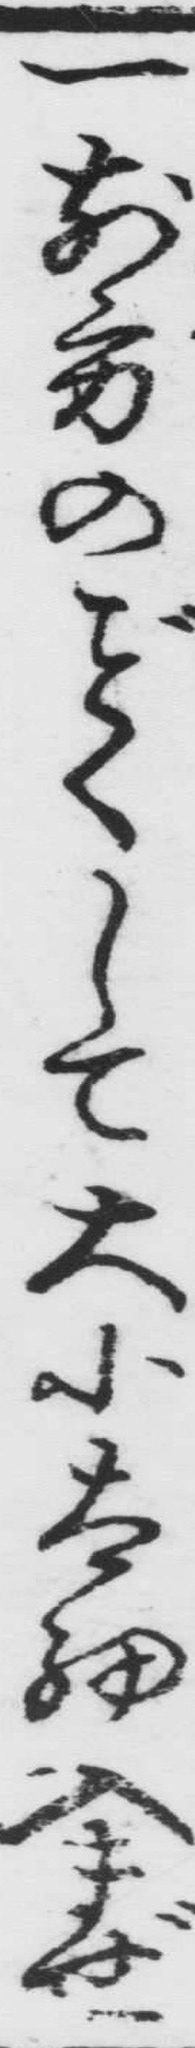一前方のごとくして大小太細入まぜ
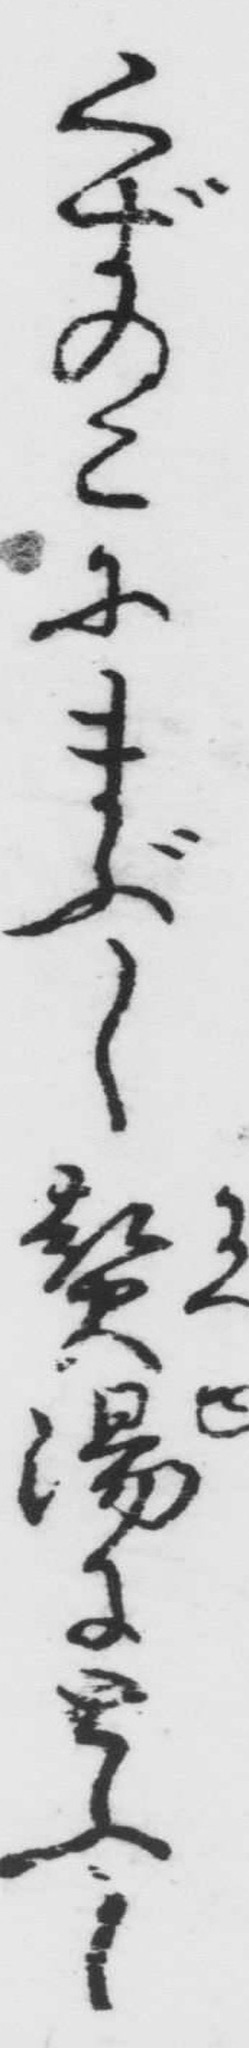くずのこにまぶし熱湯にとふし
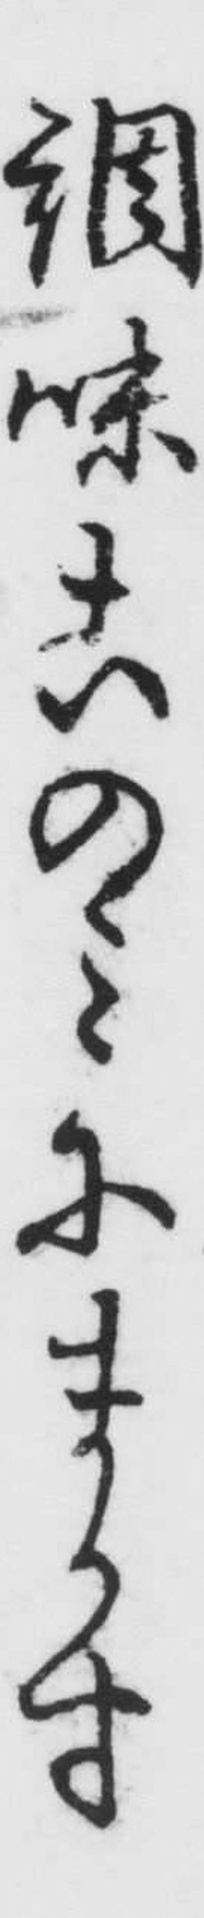調味このみにまかす
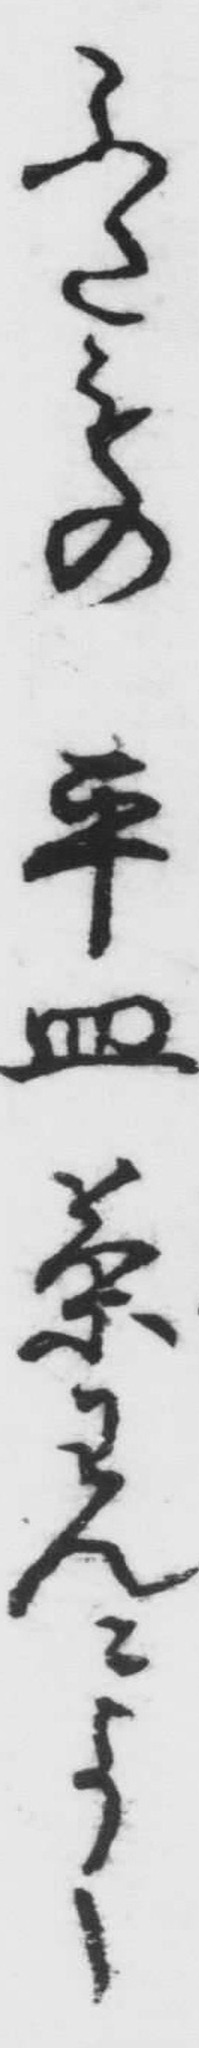ふたもの平皿茶わんによし
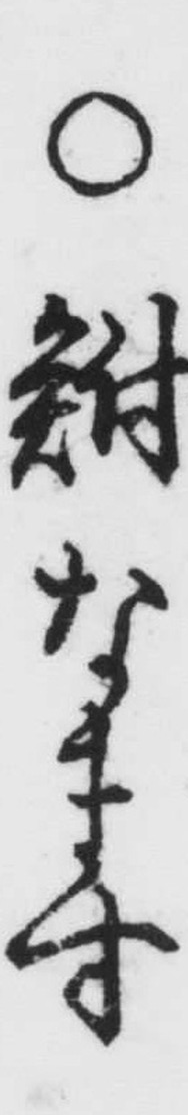○鮒なます
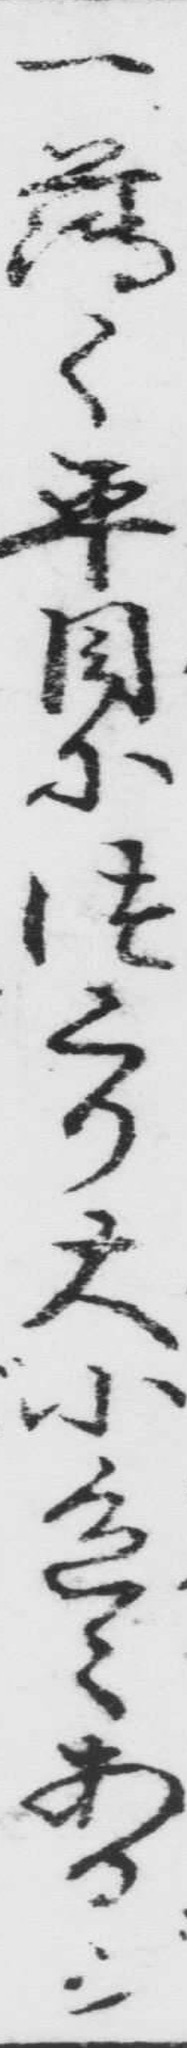一薄く平目につくり大小色々あるが
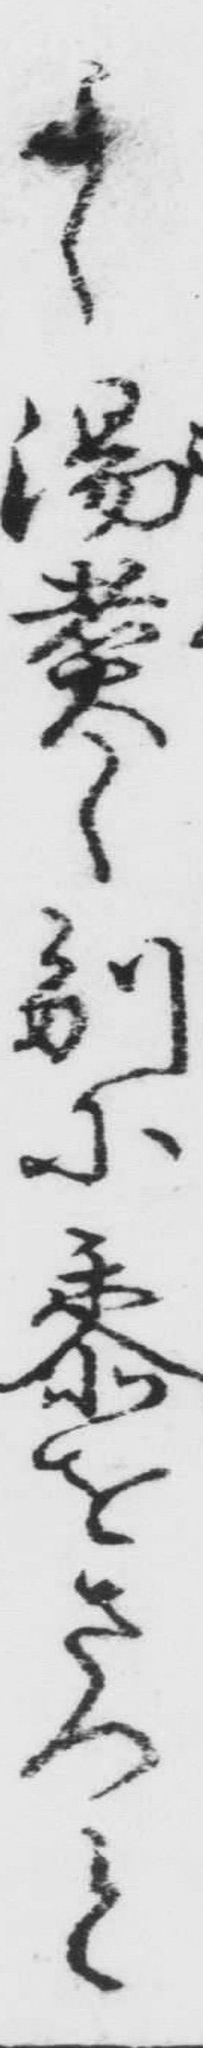よし湯煮し別に黍をさつと
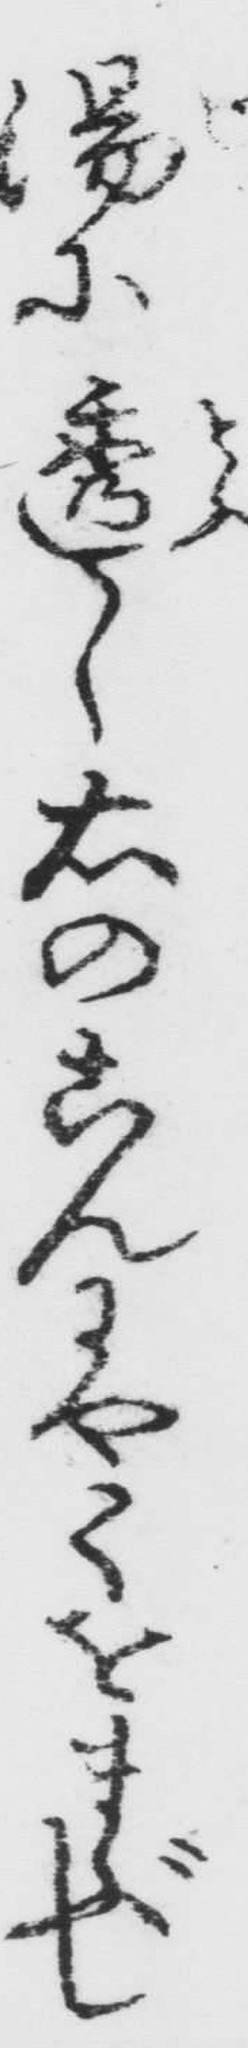湯に透し右のこんにやくをまぶし
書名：蒟蒻百珍
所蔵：大阪府立大学学術情報センター 国文学研究資料館
